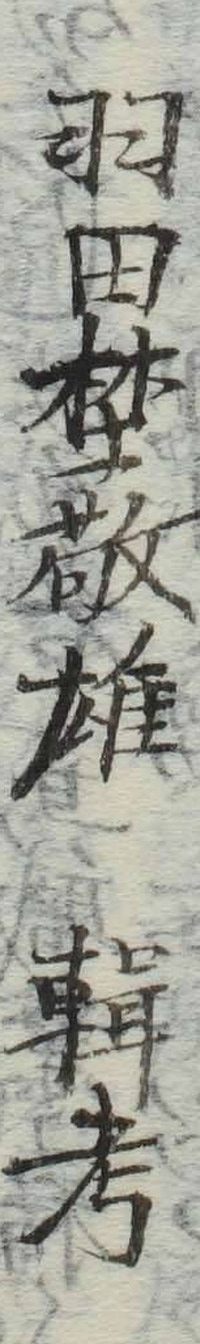羽田埜敬雄輯考

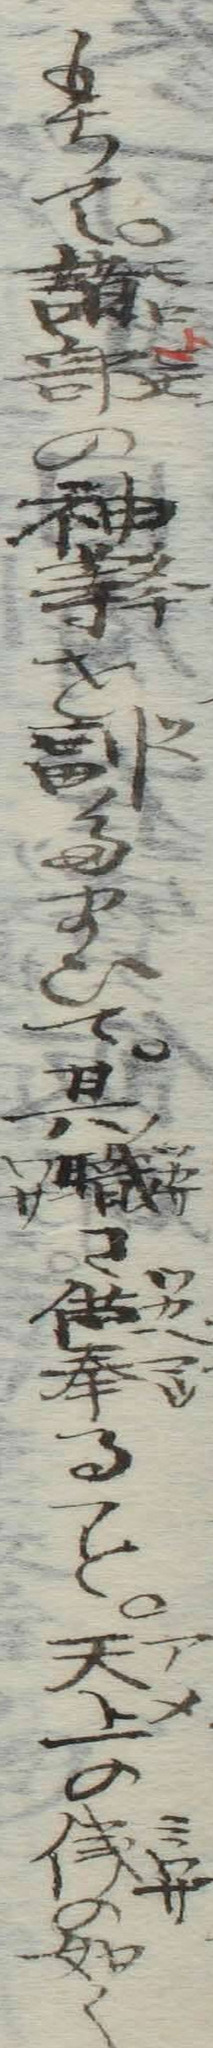もちて。諸部の神等を副たまひて。其職に傔奉ること。天上の儀の如く
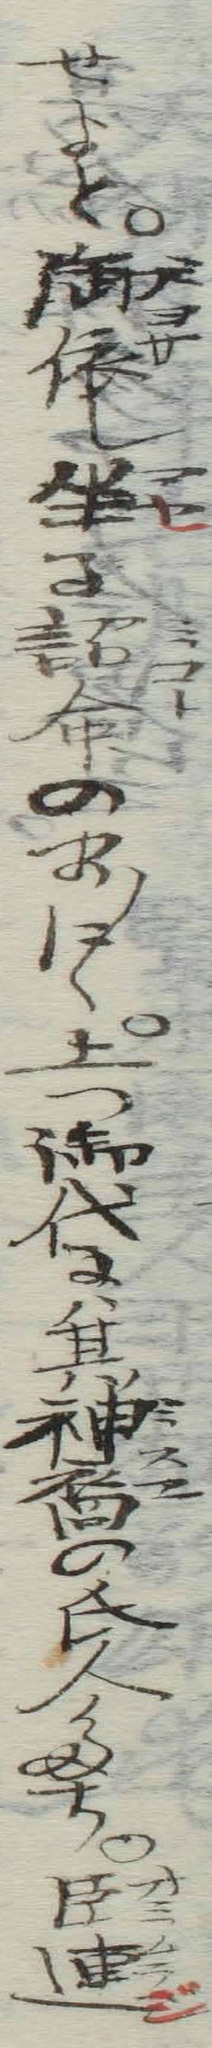せよと。御依し坐る詔命のまに〳〵。上つ御代には其神裔の氏人たち。臣連
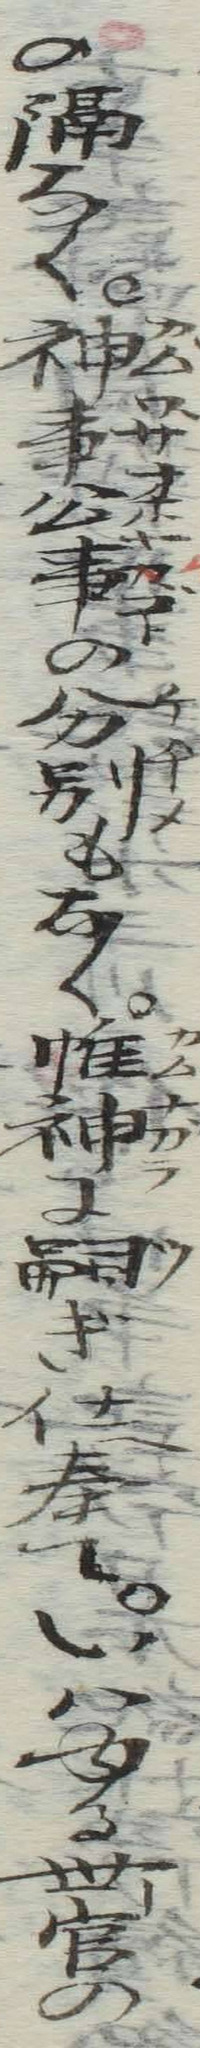の隔なく。神事公事の分別もなく。帷神に嗣ぎ仕奉て。いはゆる世-官の
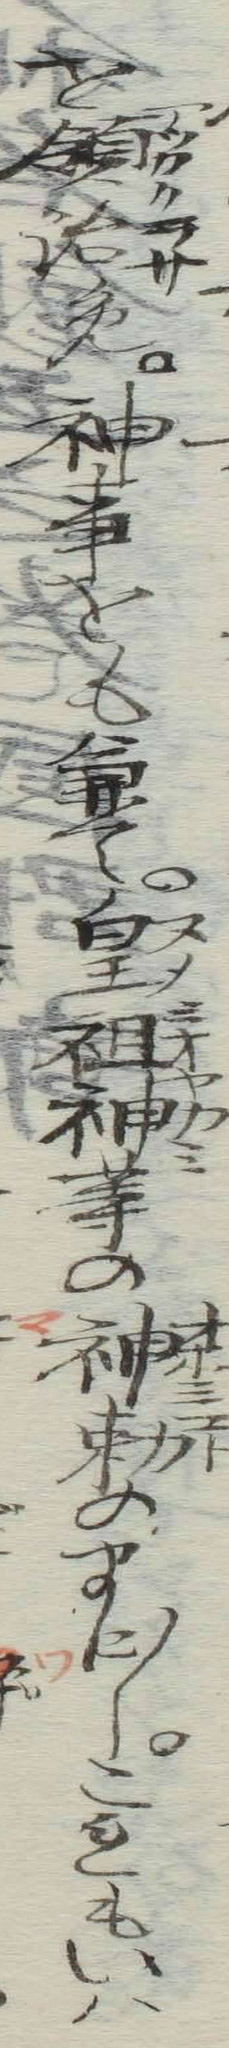を領治め。神事をも兼て。皇祖神等の神勅のまに〳〵。これもいは
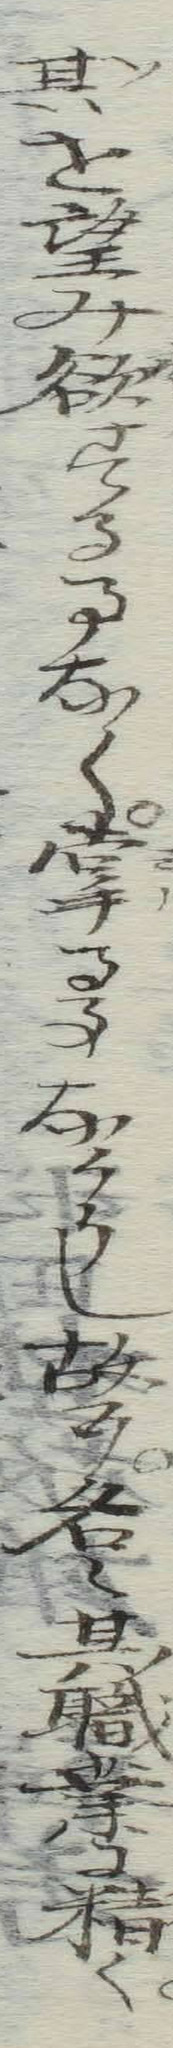其を望み欲する事なく。掌る事なかりし故に。各々其職業に精く。
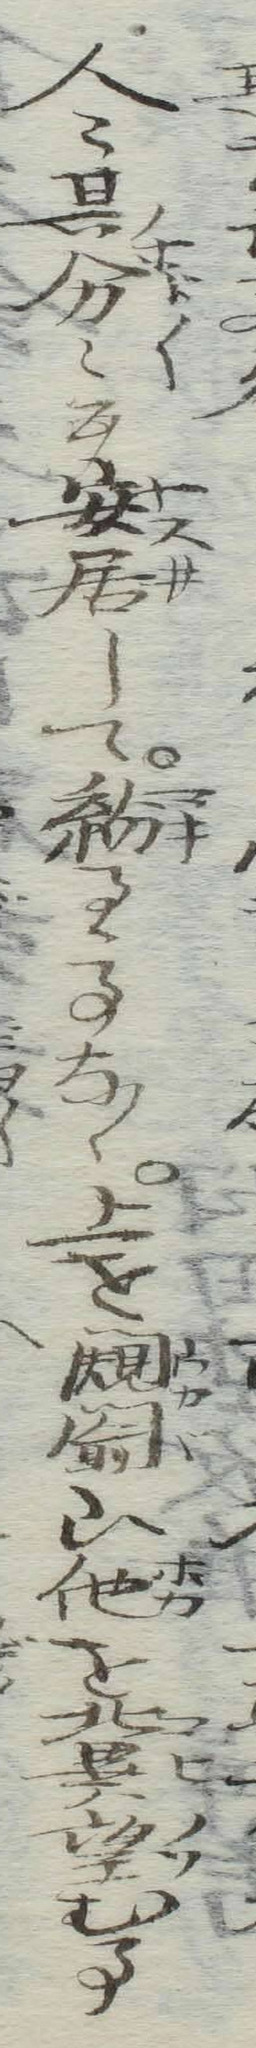人々其分々に安居して。紛るゝ事なく。上を闚闞ひ他を冀望む事
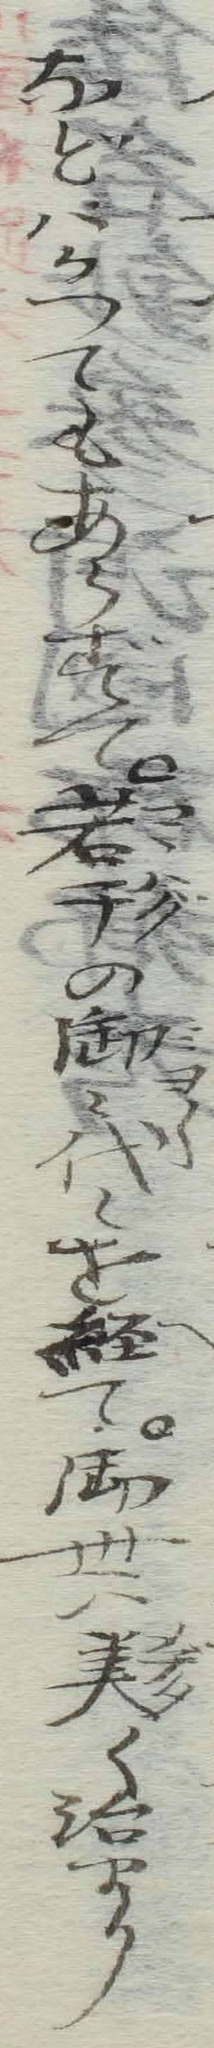などはかつてもあらずて。若干の御々代々を経て。御世は美く治まり
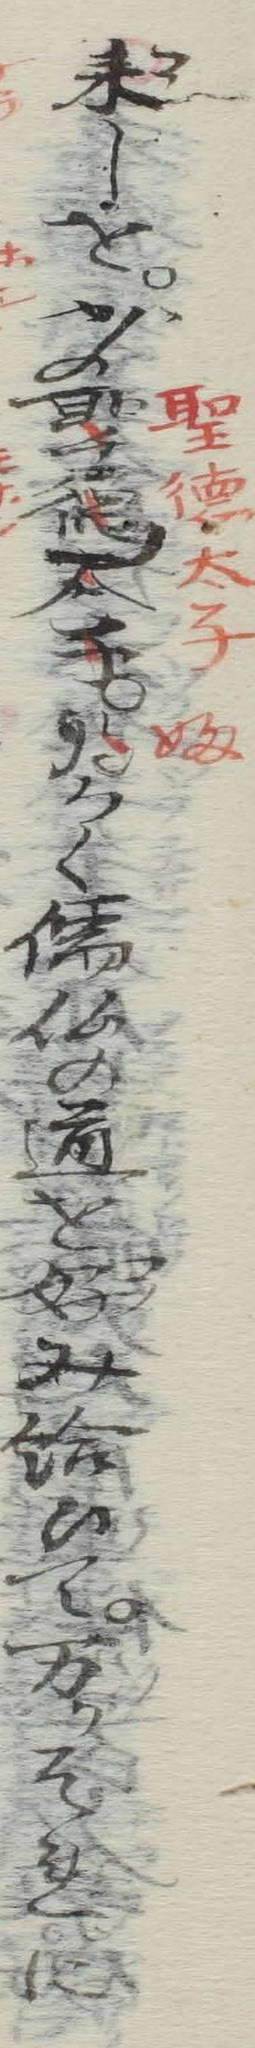来しを。かの聖徳太子。ふかく儒仏の道を好み給ひて。万それに
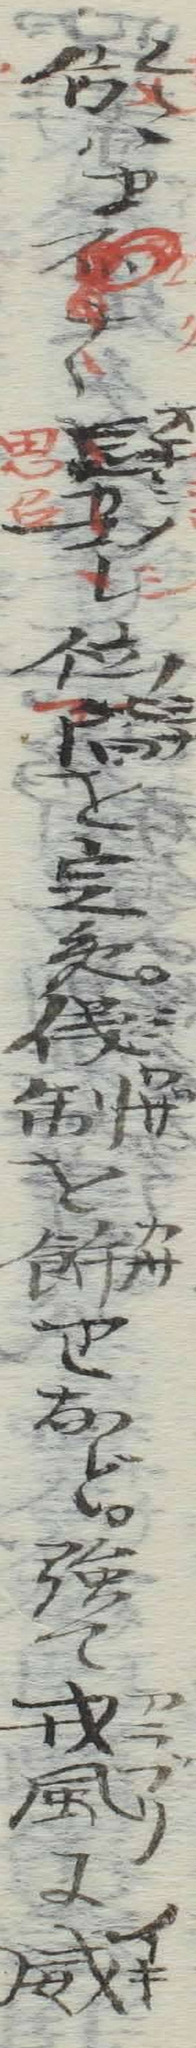倣はまほしく思召し位階を定め。儀制を飾りなど。強て戎風に威
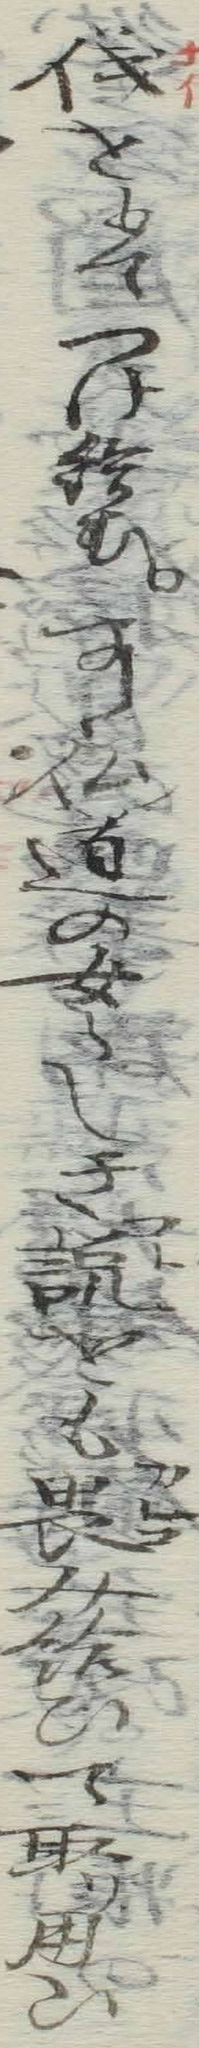儀をもてつけ給む。また仏道の女々しき説をも畏み給ひて取用ひ
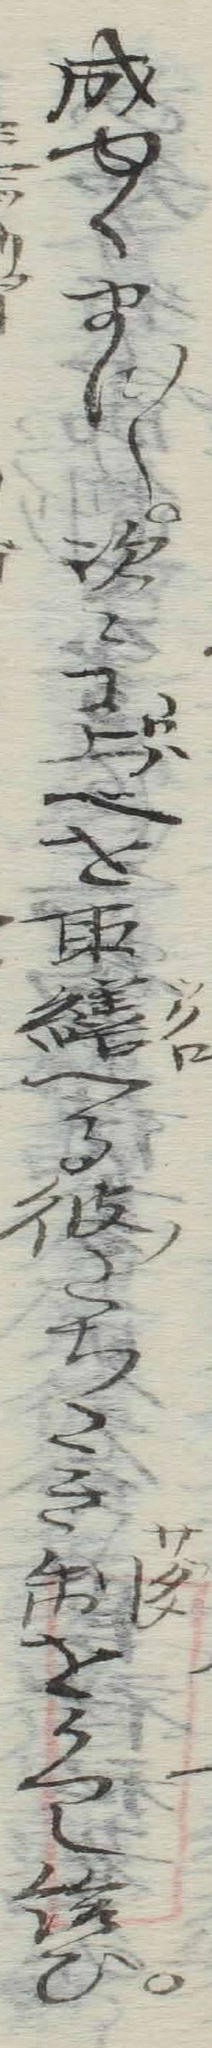成ゆくまに〳〵。次々に上べを取繕へる彼たちたき制をうつし給ひ。
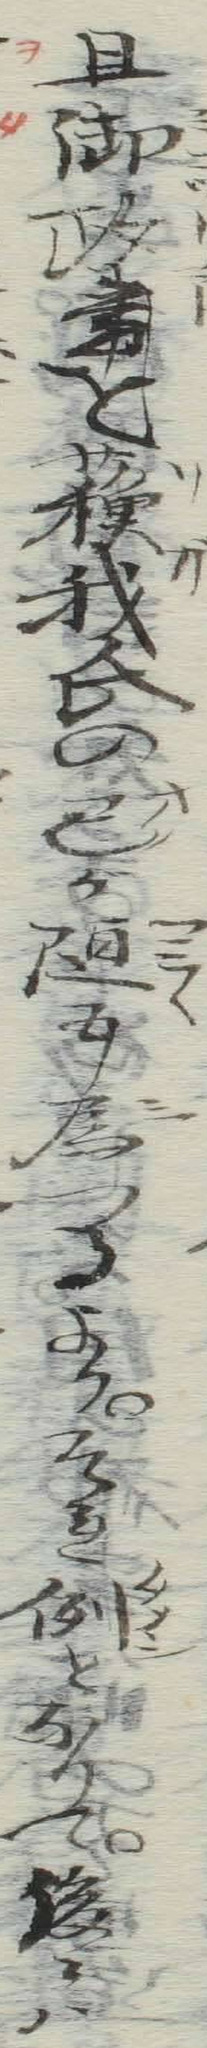且御政事を蘇我氏の己が随に為つるより。それ例となりて。後には
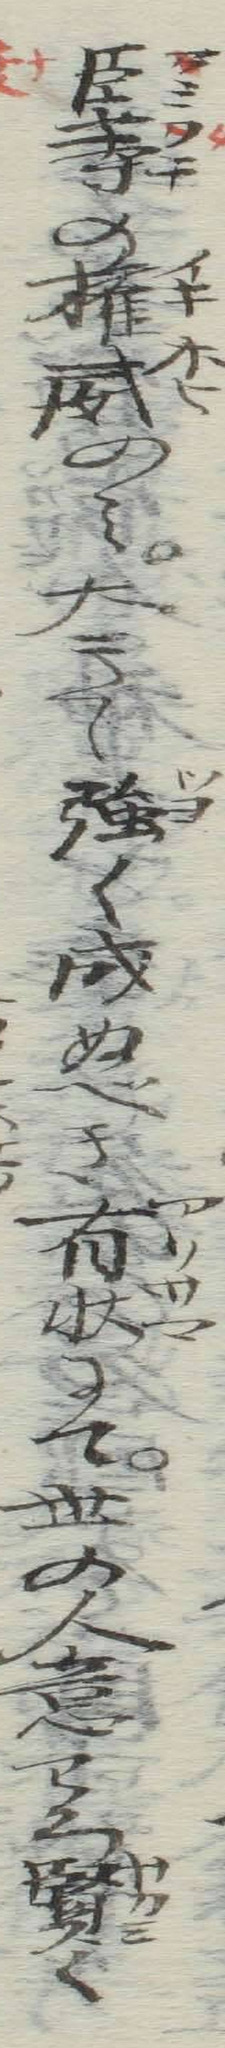臣等の権威のみ。大きく強く成ぬべき有状にて。世の人意わかつ賢く
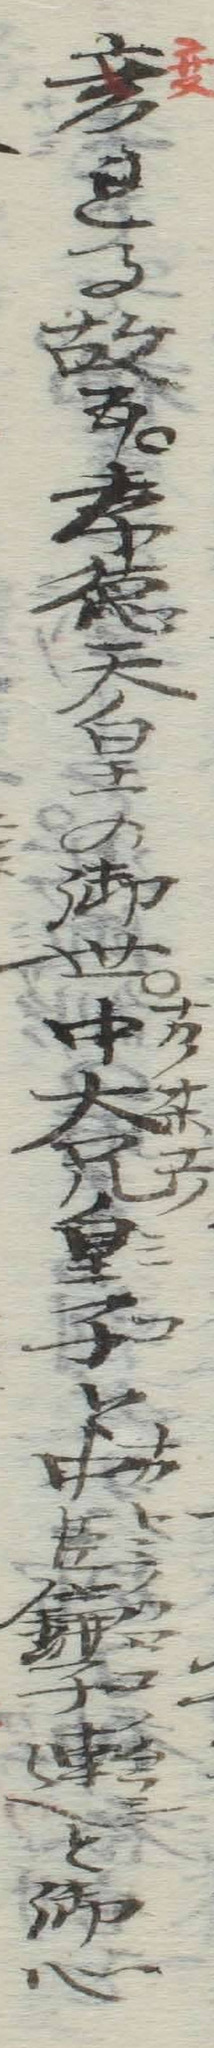変れる故に。孝徳天皇の御世。中大兄皇子と中臣鎌子連と御心
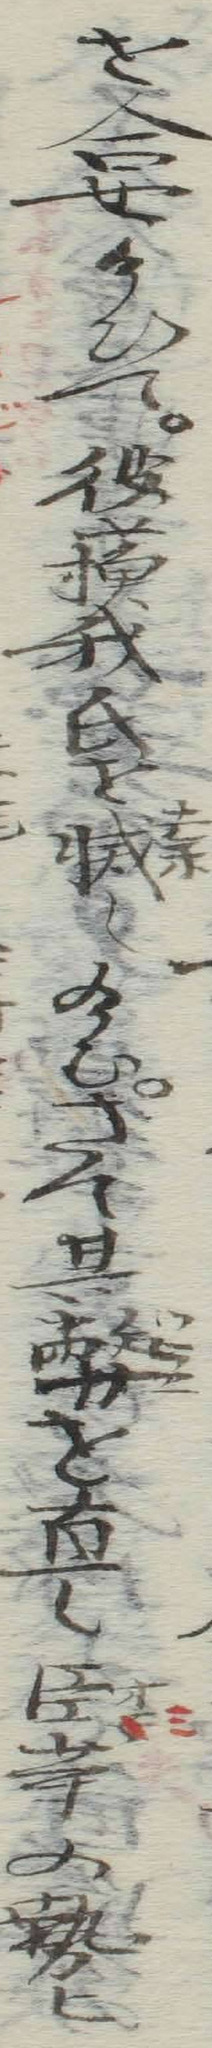を合せ給ひて。彼蘇我氏を滅し給む。さて其弊を直し臣等の勢ひ
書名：三河国古跡考
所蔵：国文学研究資料館
